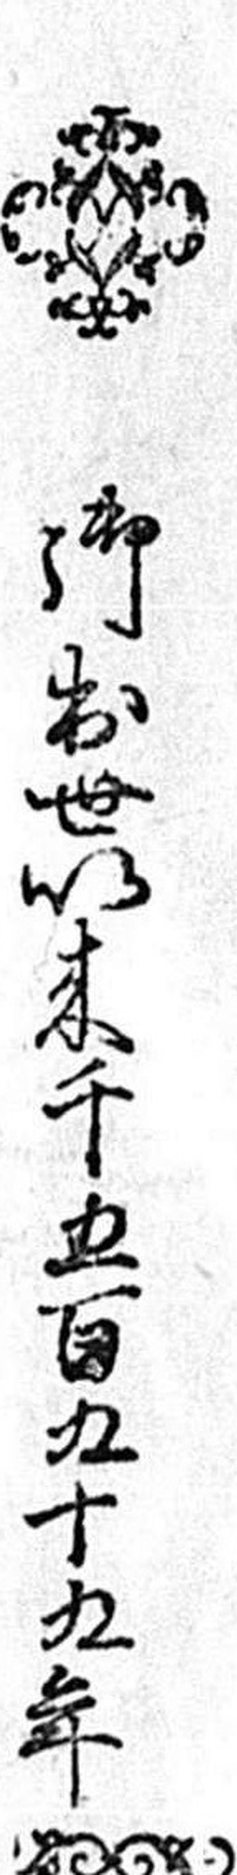御出世以来千五百九十九年
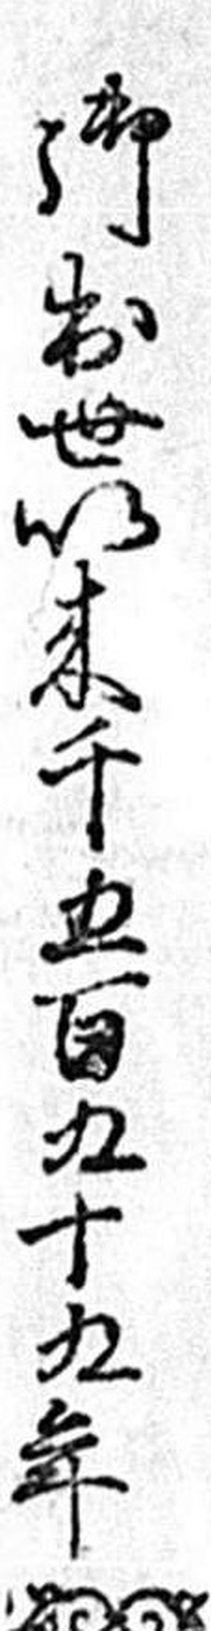御出世以来千五百九十九年
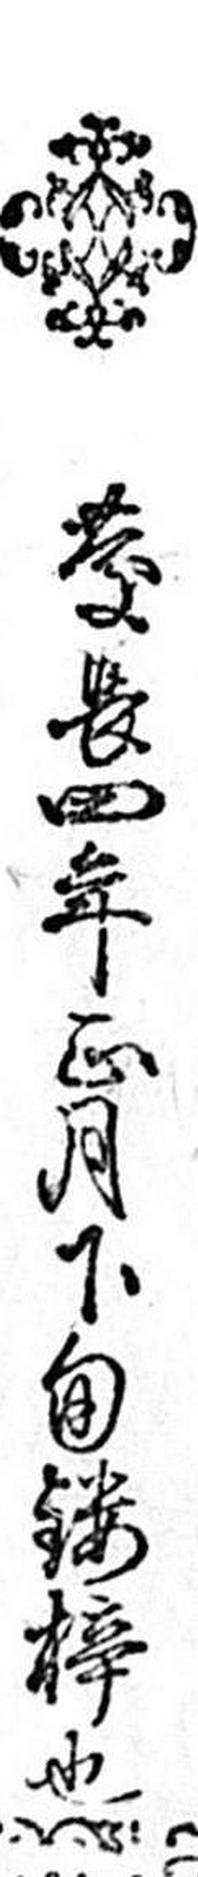慶長四年正月下旬鏤梓也
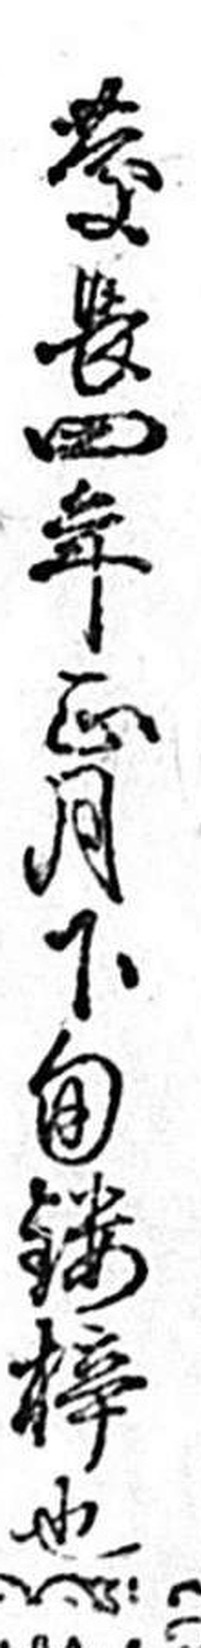慶長四年正月下旬鏤梓也
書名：Luis, de Granada: Giya do pekadoru
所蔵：[object Object]
